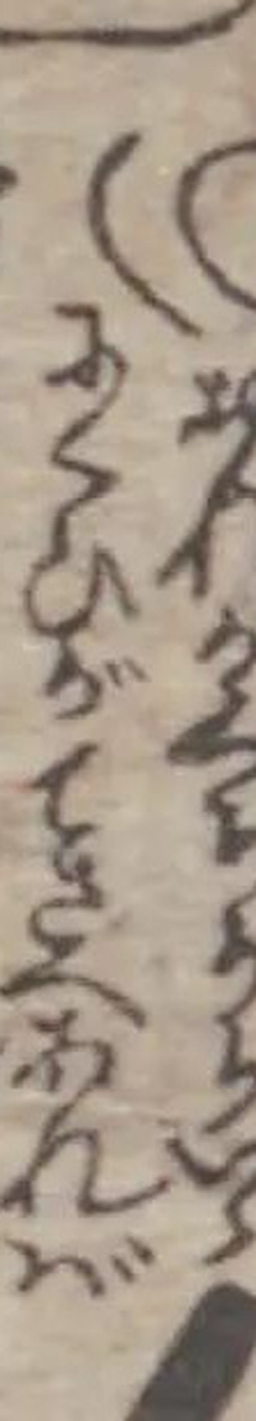にくひがてさへあれば
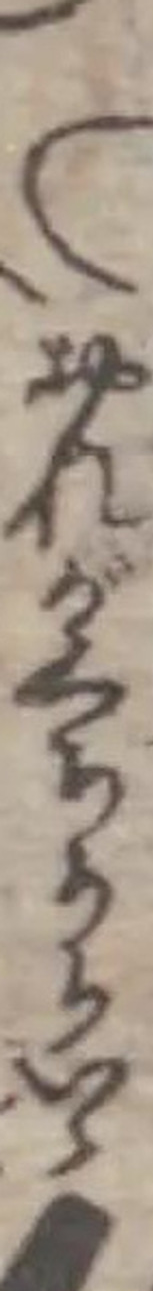おれがくちからいゝ
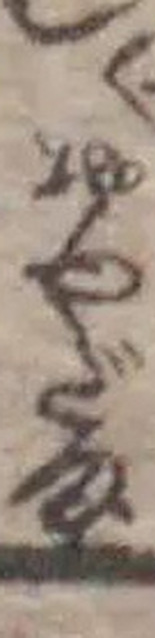おやだま
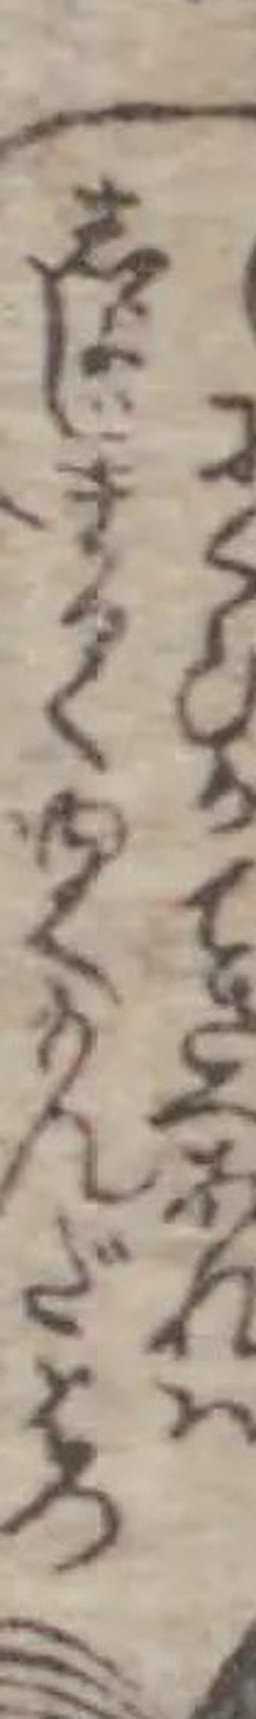しよじまるくゆくもんだはつ
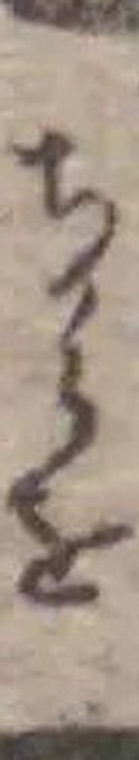ちからを
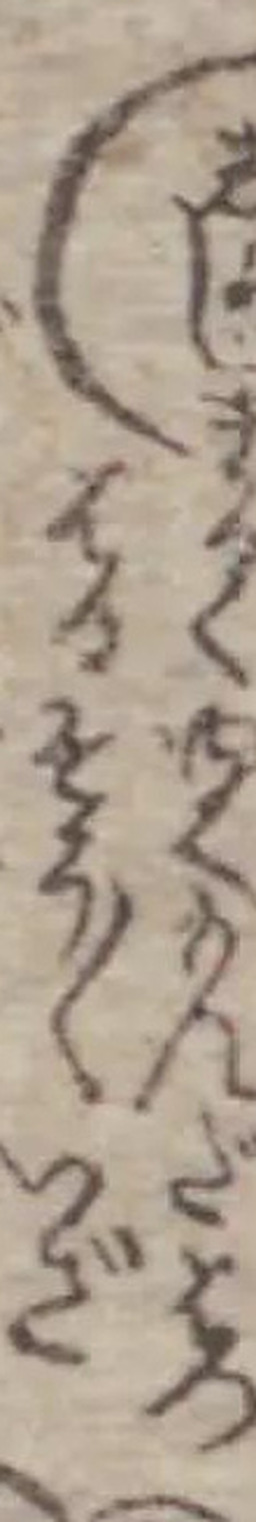はるそう〳〵いざ
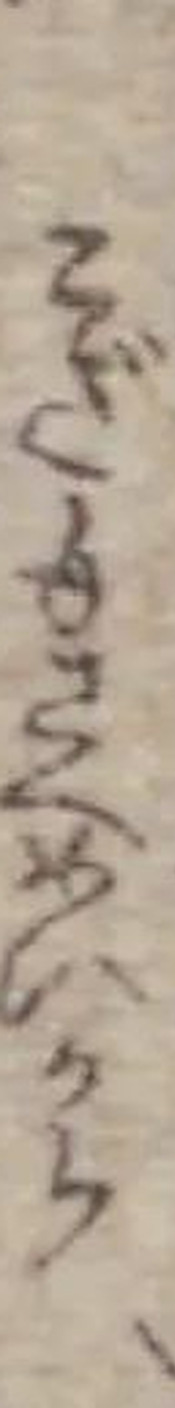こざもさへめいから
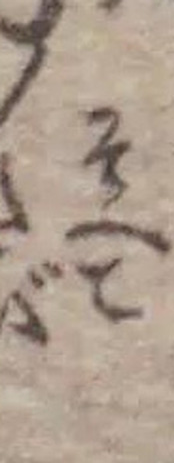そへて
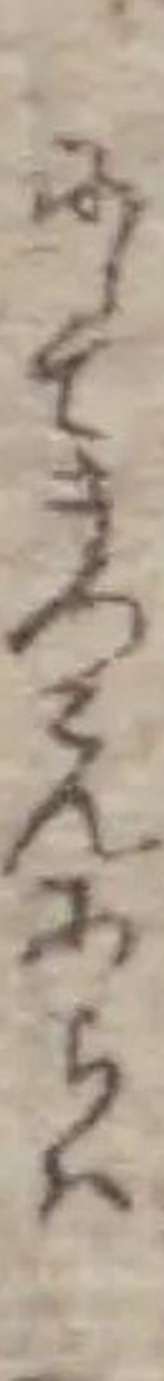にしてまつこんにちは
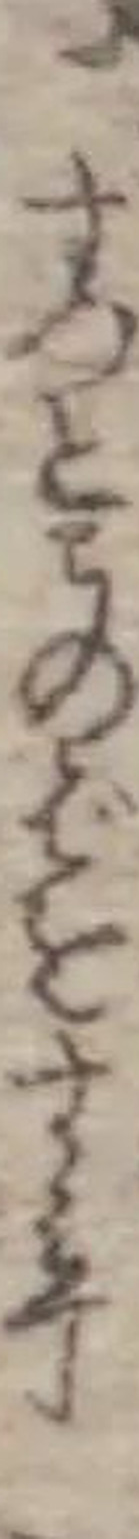ずつとこのばをすみ丁
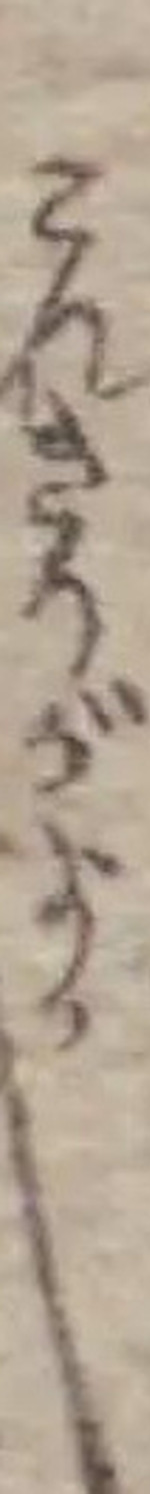これきりがよか
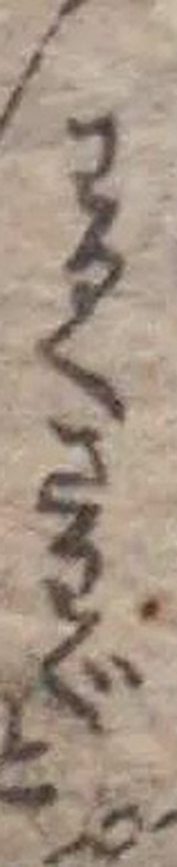わるへさわぐと
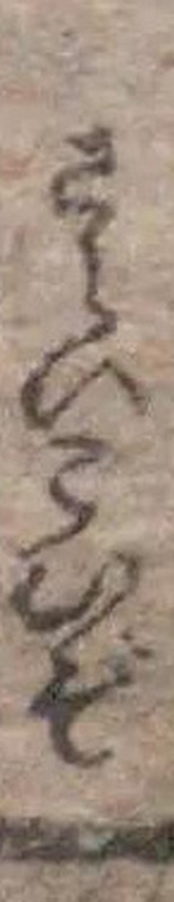さらいこむぞ

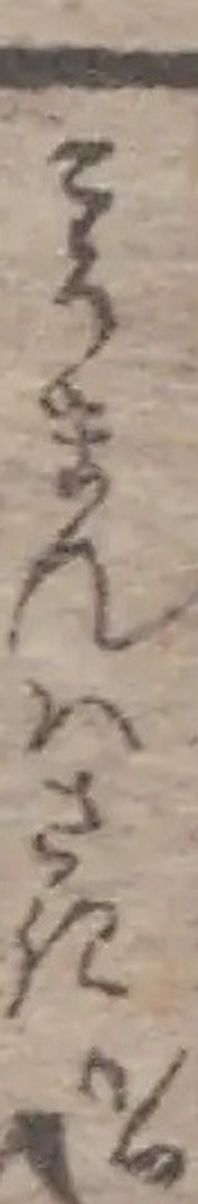こうまんはさき
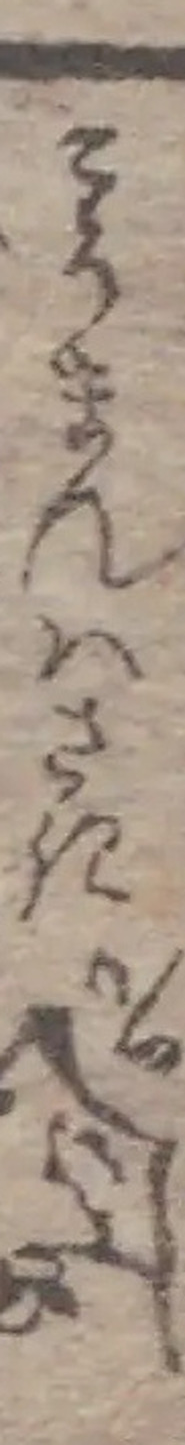こうまんはさき
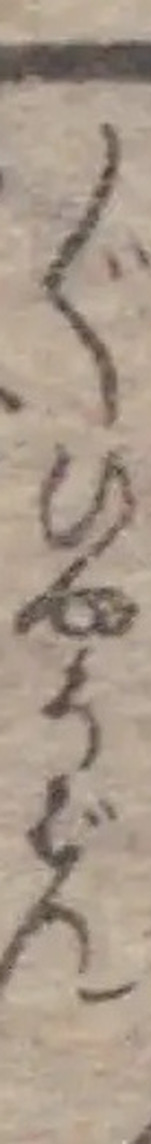〴〵ひやうばん
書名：富多高慢噺 3巻
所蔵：国立国会図書館 National Diet Library, JAPAN
